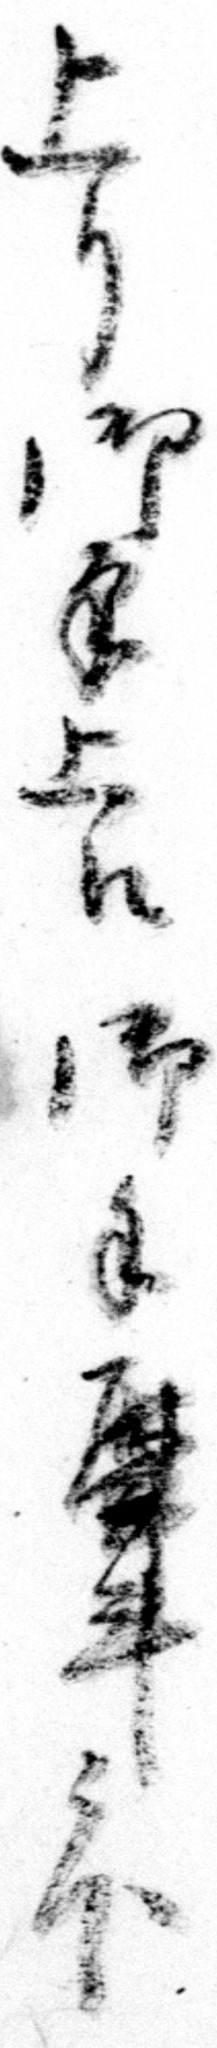上り御筆上ル御手熨斗之下

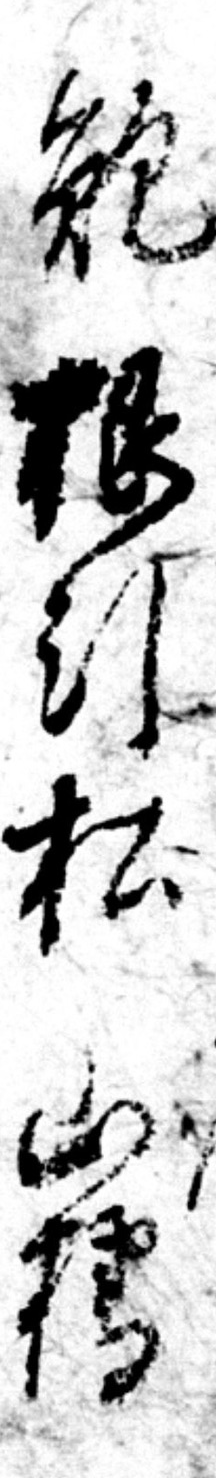鮑根引松山橘
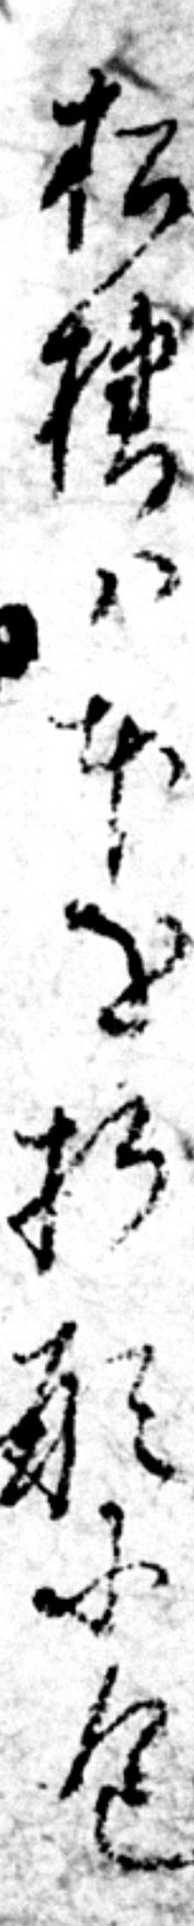松橘ハ本を折形に包
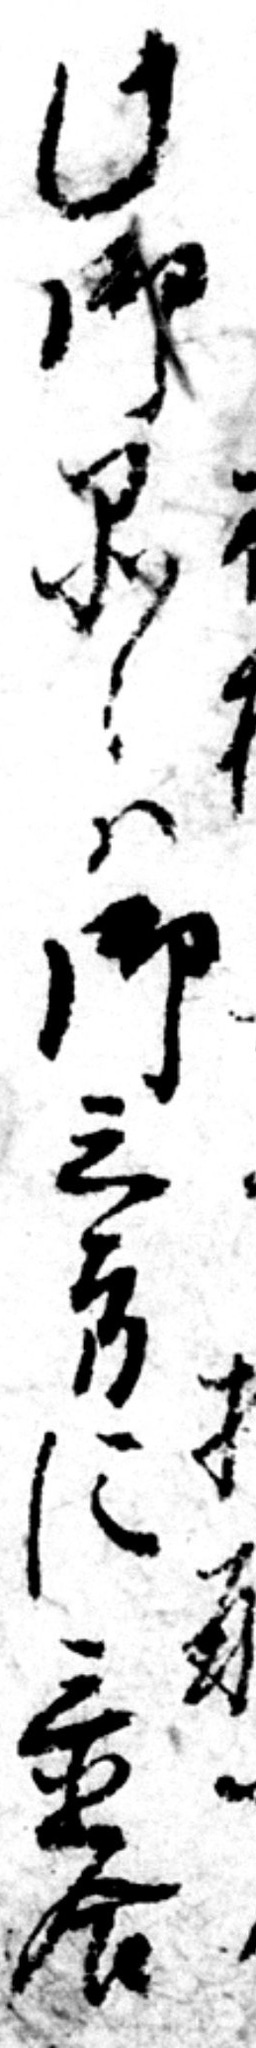此御品々ハ御三方に置合
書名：光姫様御かねはじめ御式
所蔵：徳島県立図書館
